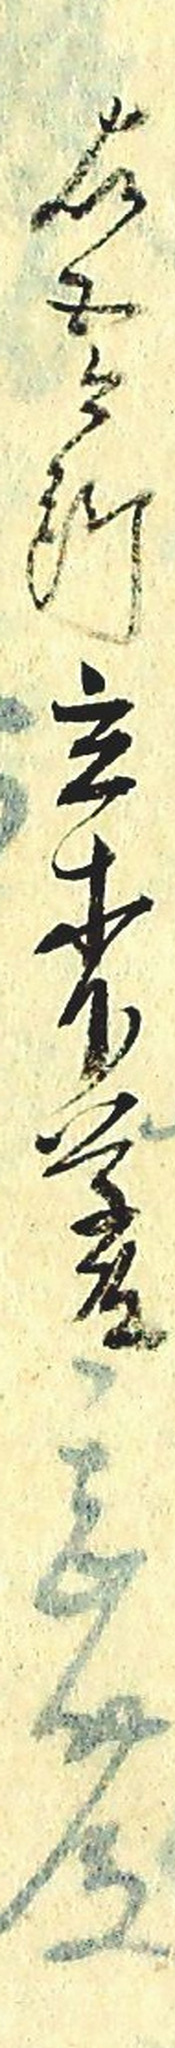右五ヶ所立木下草共
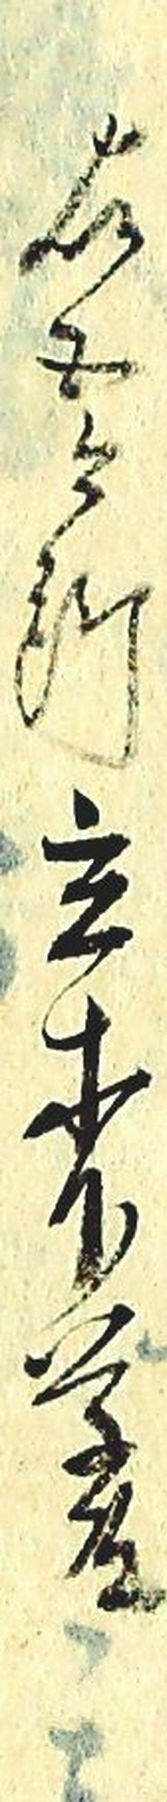右五ヶ所立木下草共
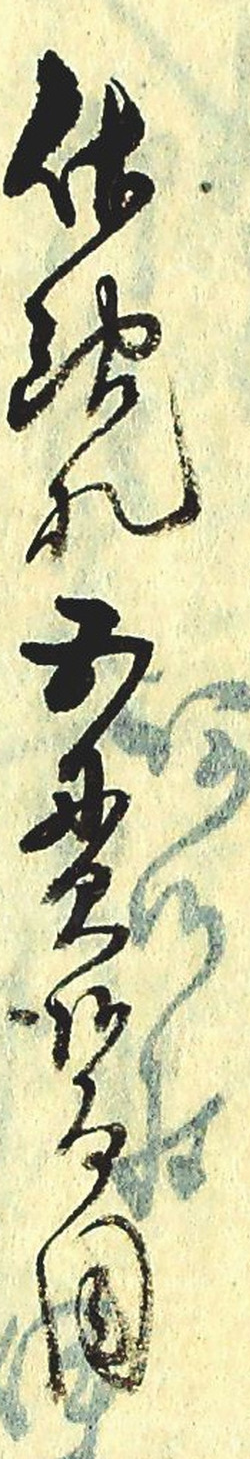代銀札五貫弐百目
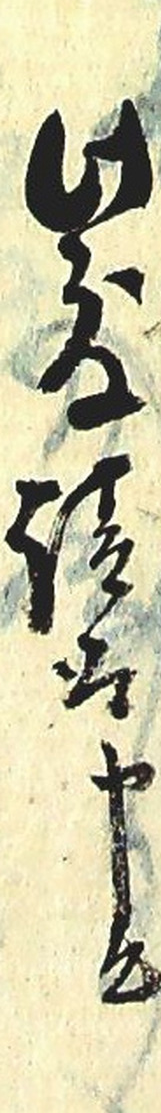此度請取申候
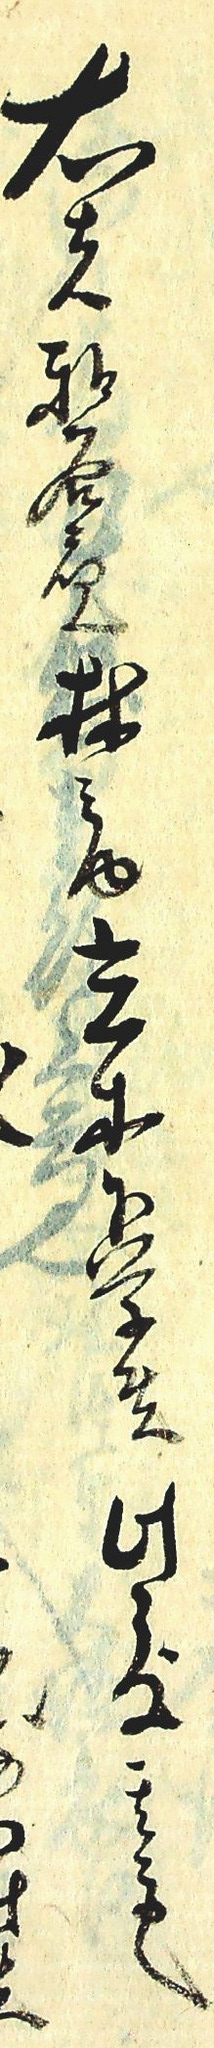右は私名負林之内立木下草共此度其方へ
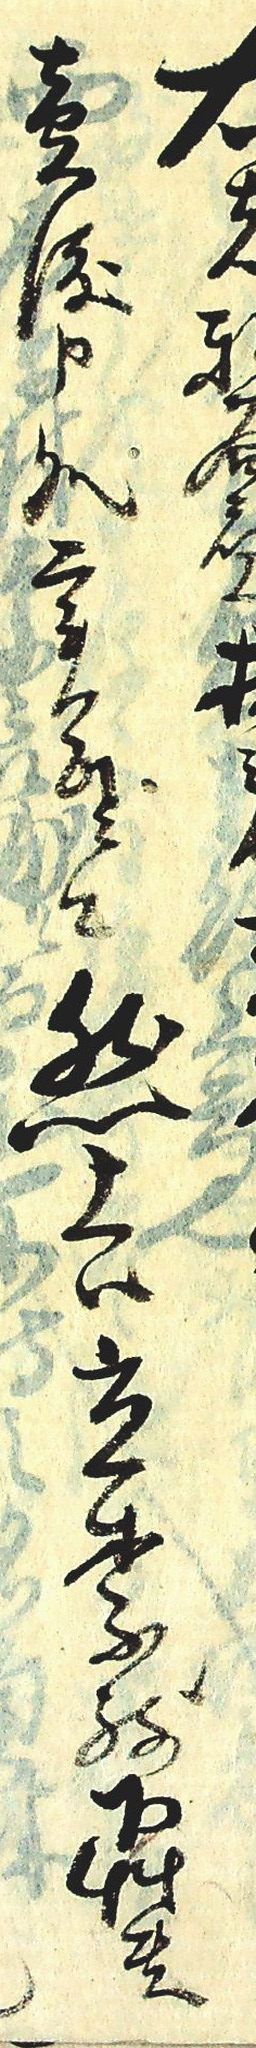売渡申処実正に候然上は立木不残下草共
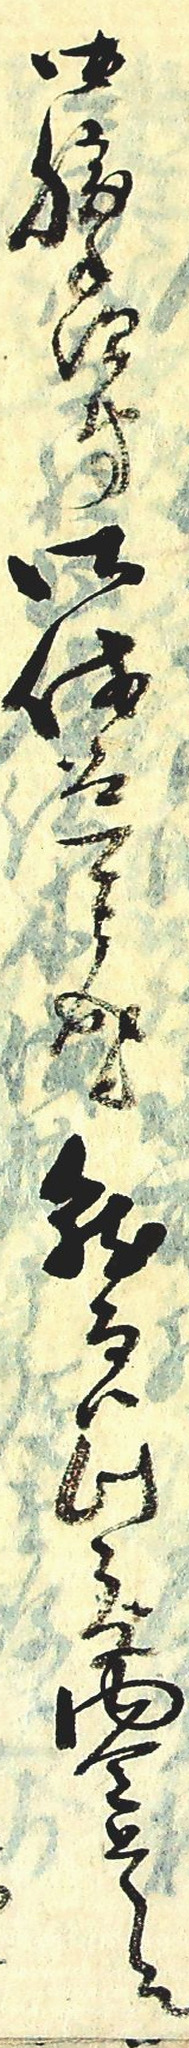御勝手次第御伐取可被成候就ては此度内金として
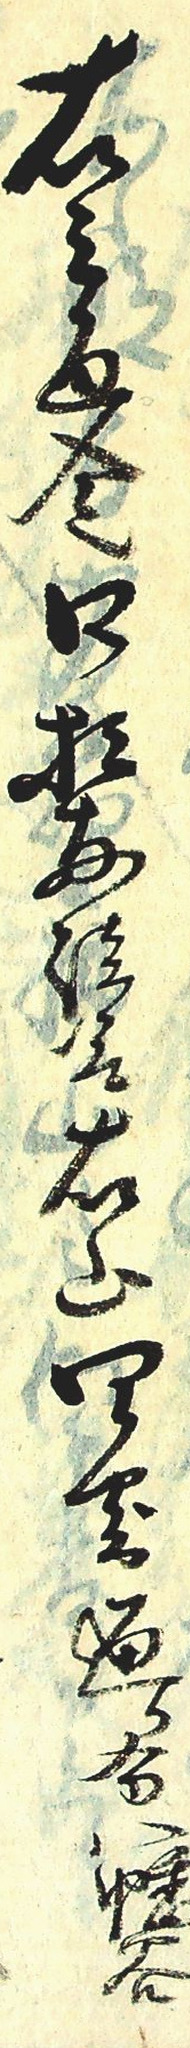右之通金四拾両請取右山四歩通り分八幡谷
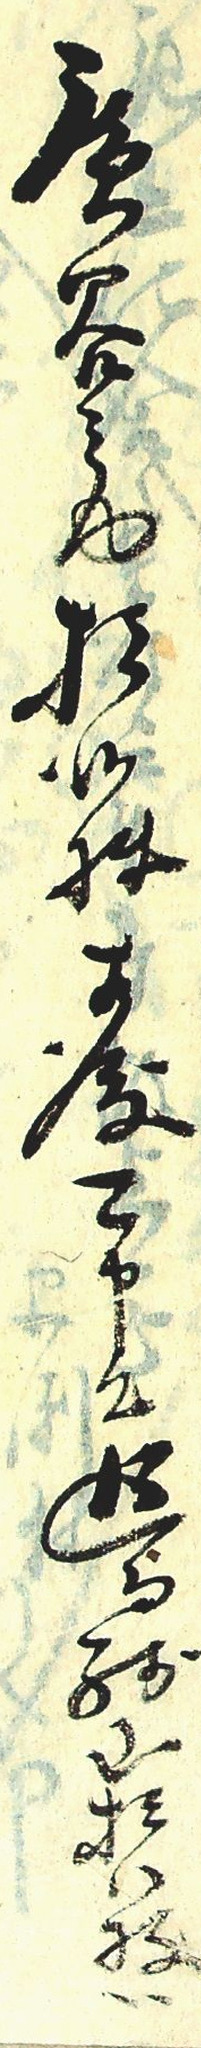広谷之内拾弐株相渡可申候追て残山拾八株は

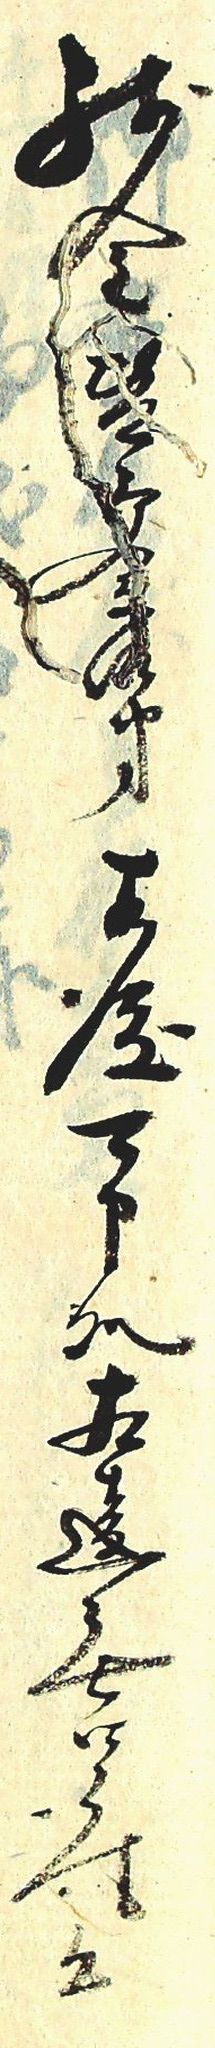残金堅受取次第相渡可申処相違無御座候
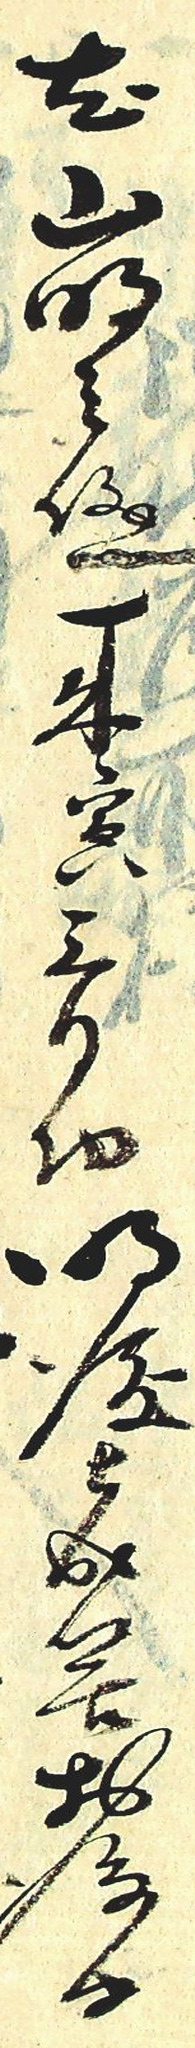尤山明之儀は来寅三月切明渡相成筈於後日
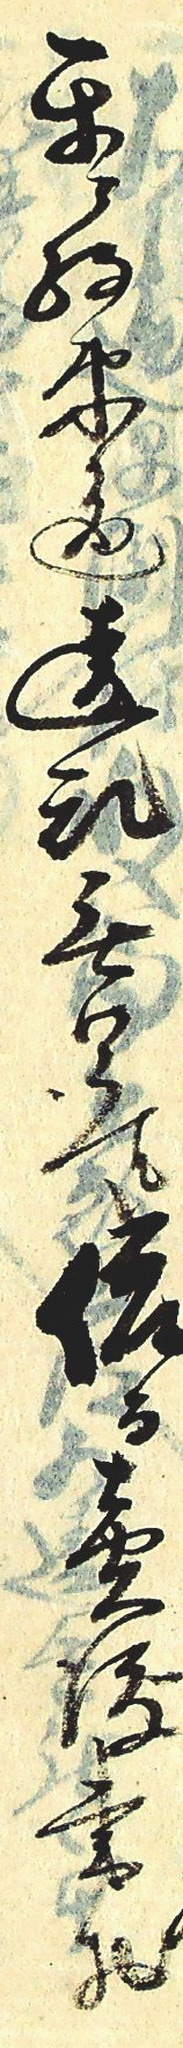互に約束通違乱無御座候依て売渡書物
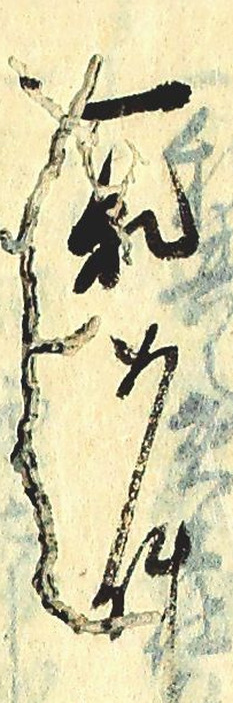一札如件
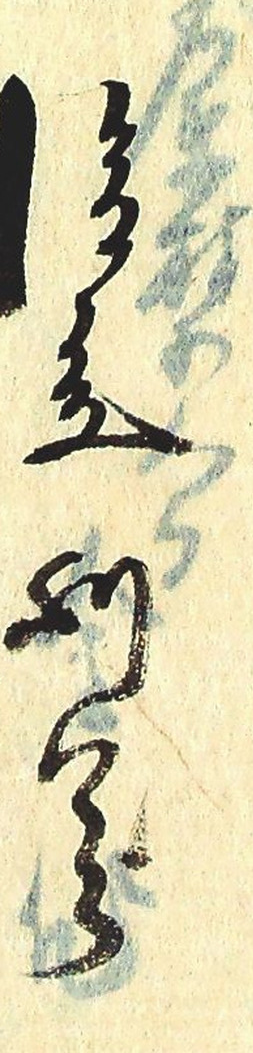後藤利八郎
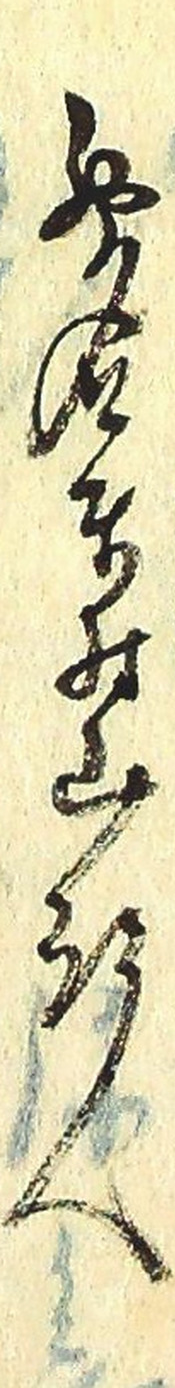西名東村山人
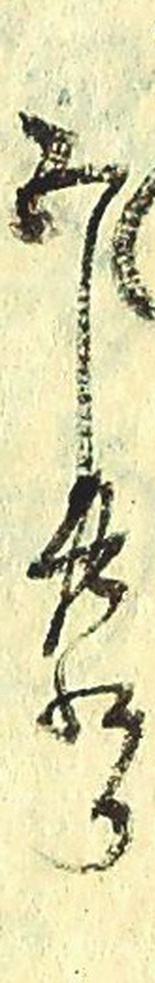五月廿九日
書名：諸御願書控(弐番）
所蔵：鳴門教育大学 Naruto University of Education
